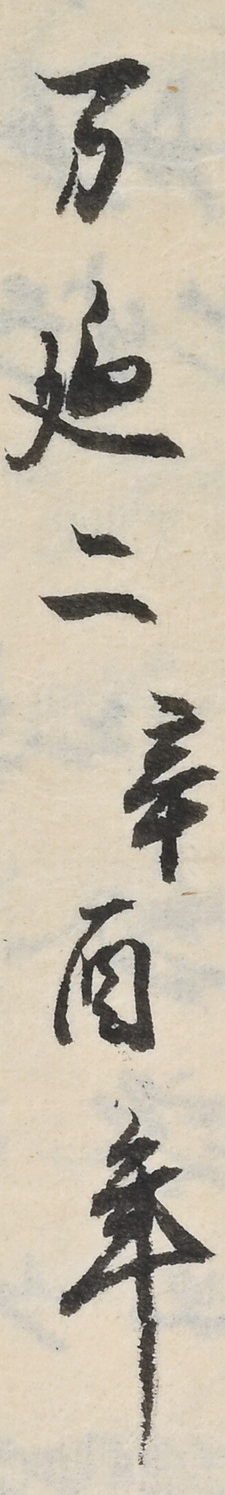万延二辛酉年
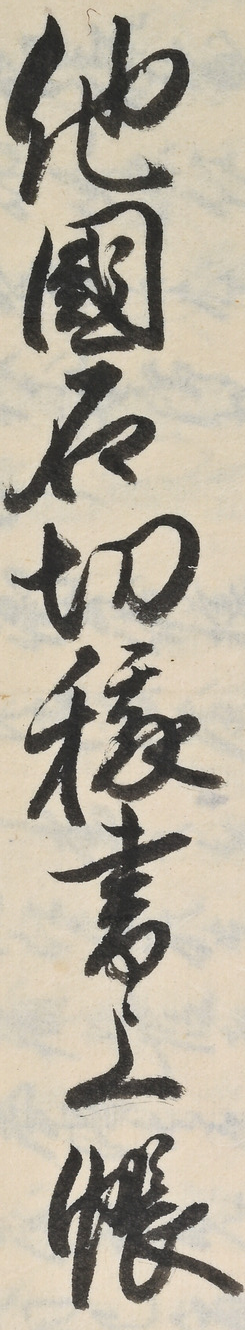他国石切稼書上帳

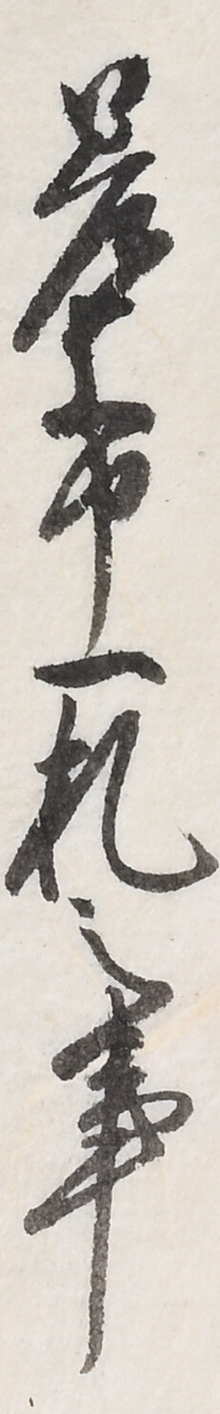差上申一札之事
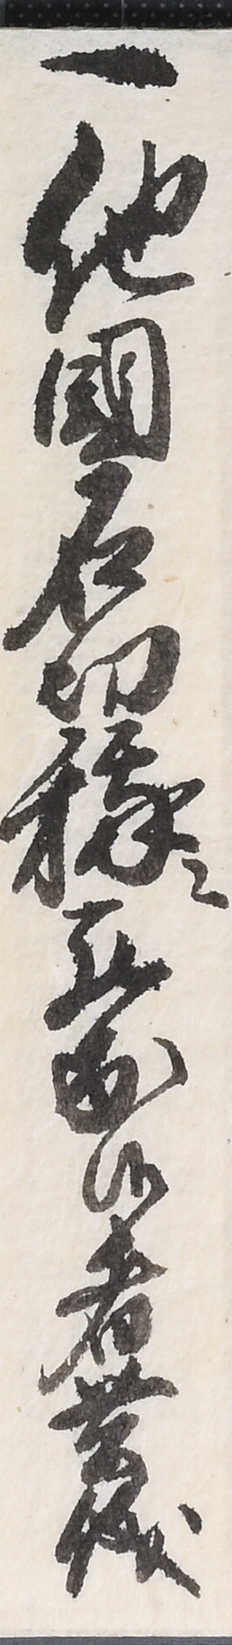一他国石切稼ニ罷出候者共儀
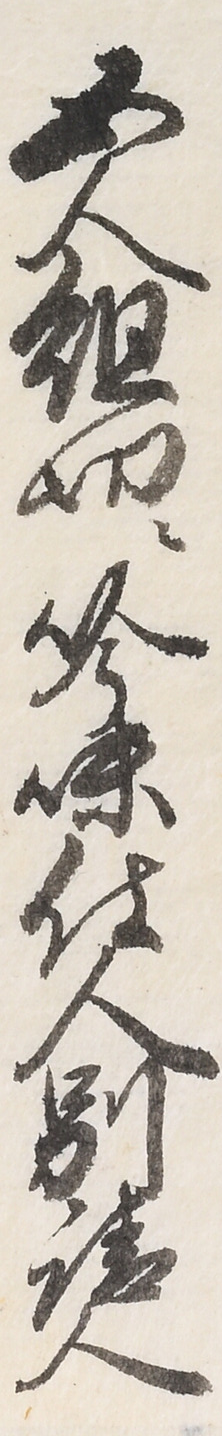五人組切ニ吟味仕人別請人
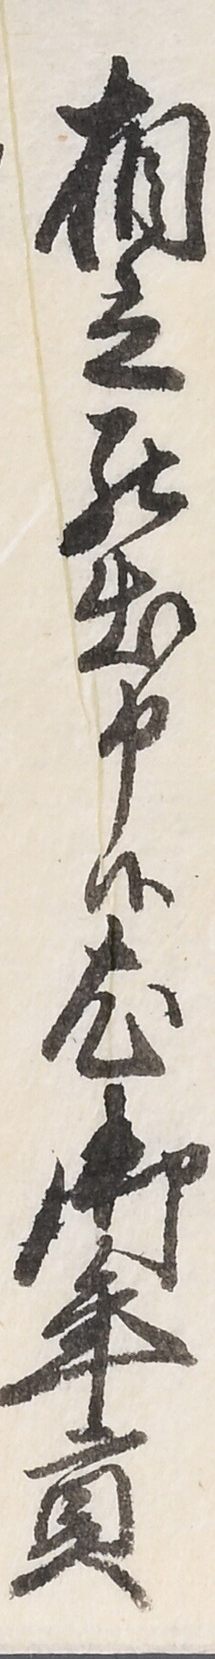相立罷出申候尤御年貢
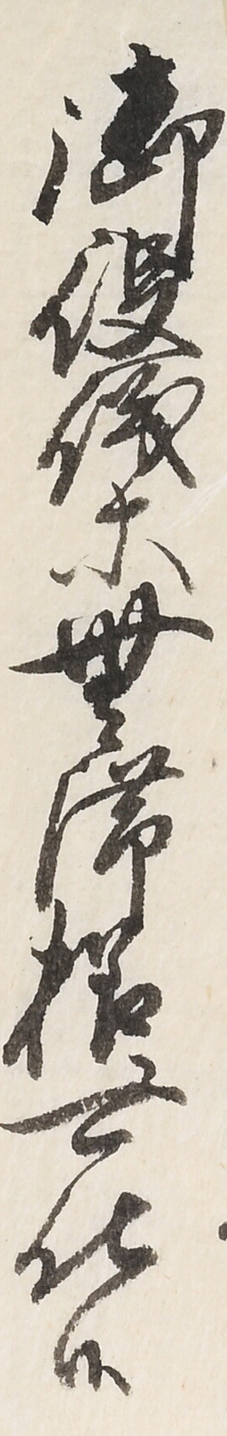御役儀等無滞様可仕候
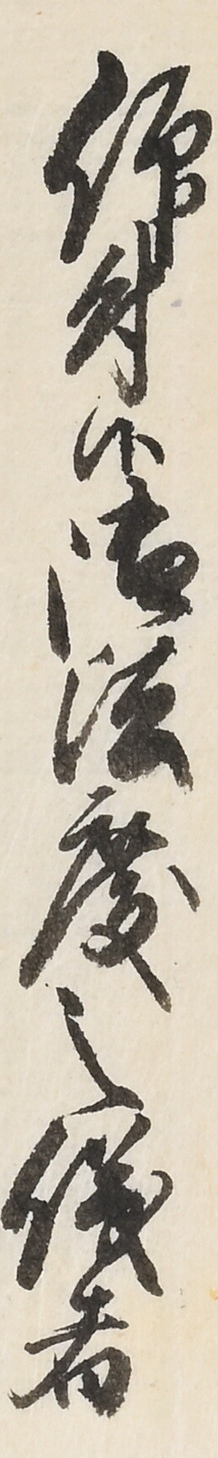仰付候御法度之儀は
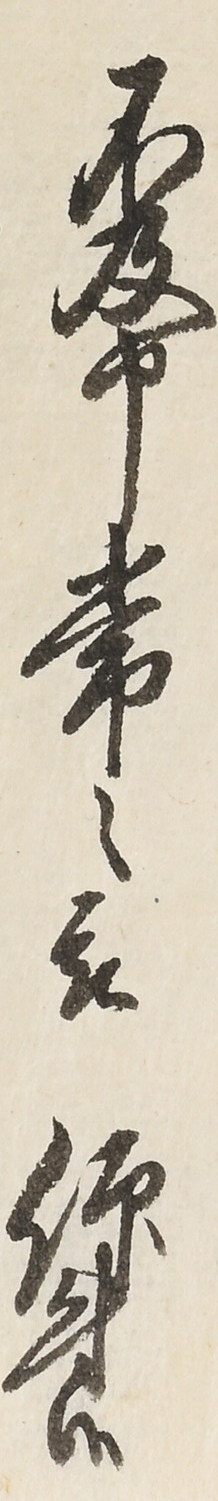不及申常々被仰付候
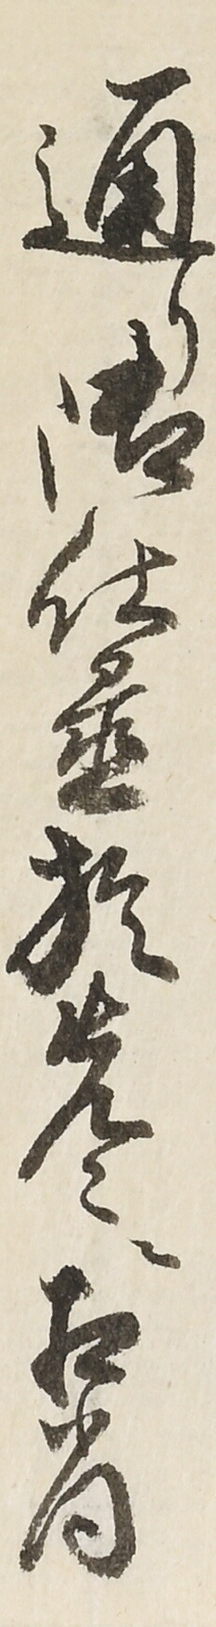通り御仕置於先々ニ相背
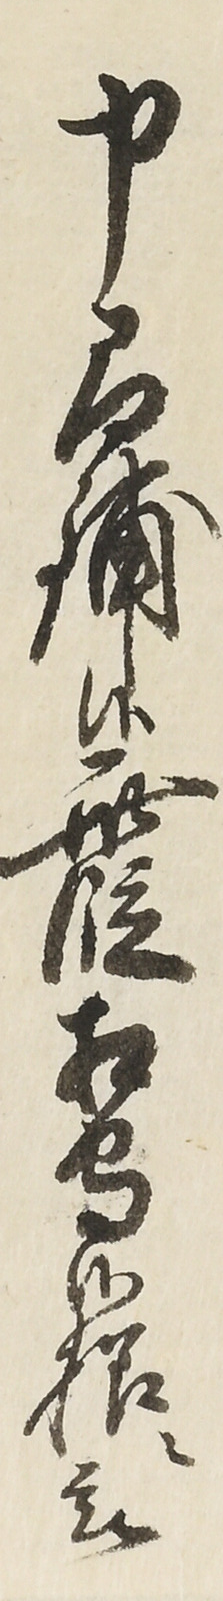申間鋪候此段相守候様ニ被
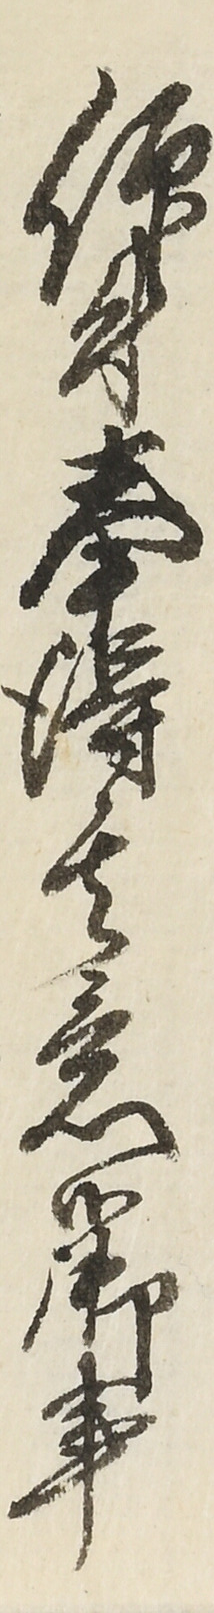仰付奉得其意候御事
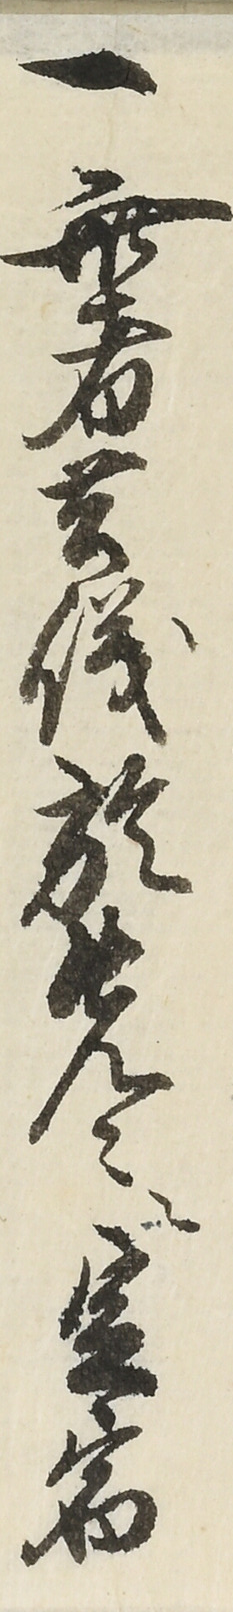一此者共儀於先々ニ定宿
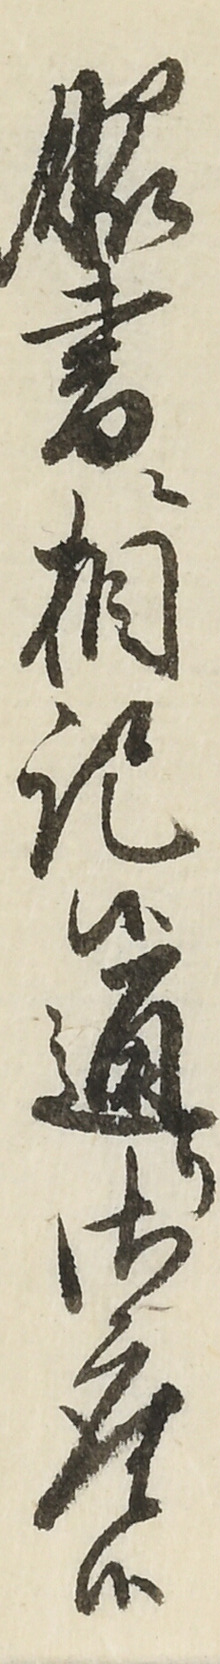脇書ニ相記候通り御座候
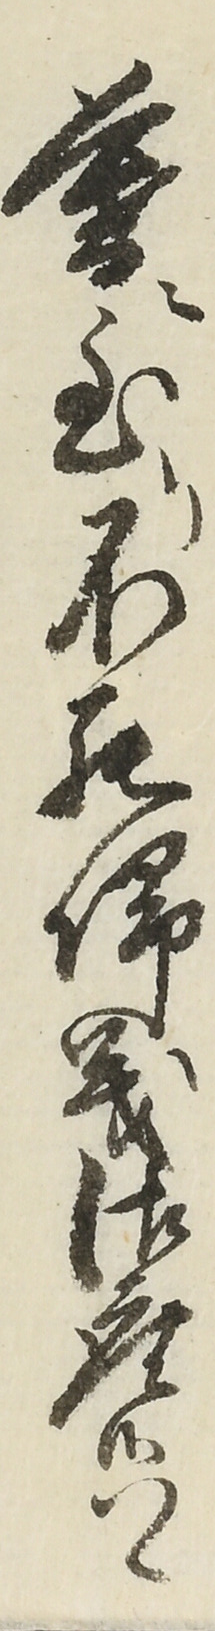暮ニ至り不罷帰羲御座候ハヽ

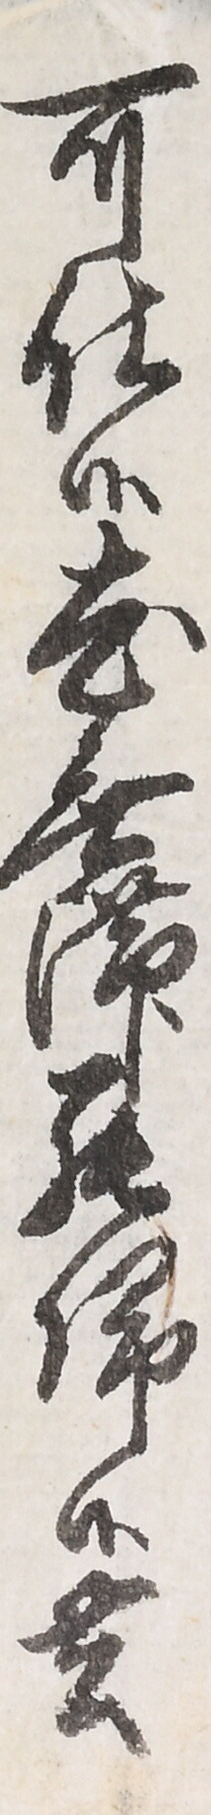可仕候尤無滞罷帰候共
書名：万延二辛酉年二月日他國石切稼書上帳
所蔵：伊那市立高遠町図書館・合同会社AMANE
